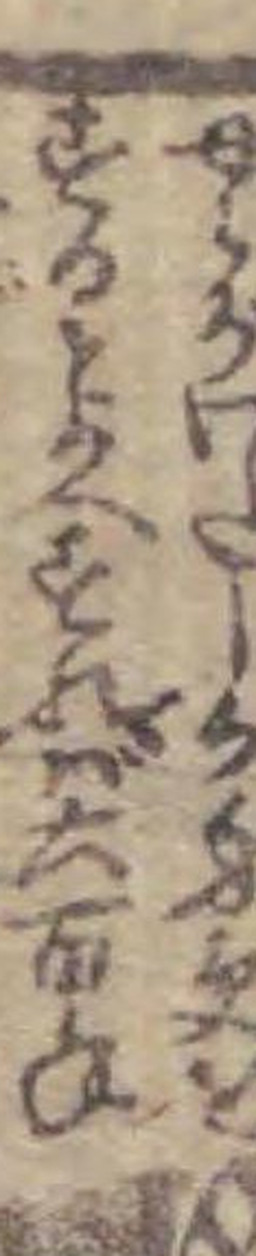するとかへすれば六百年
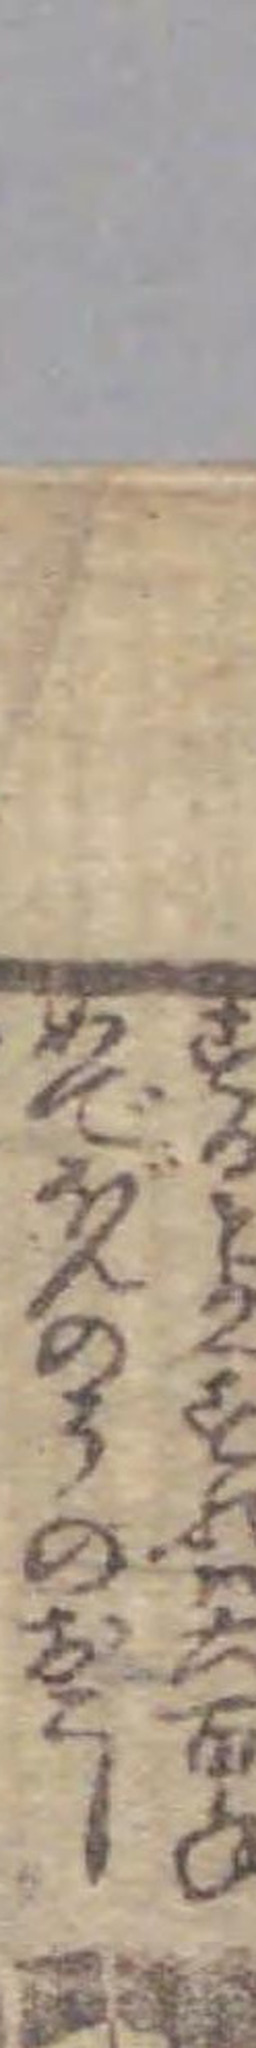めでぼんのうのおこし
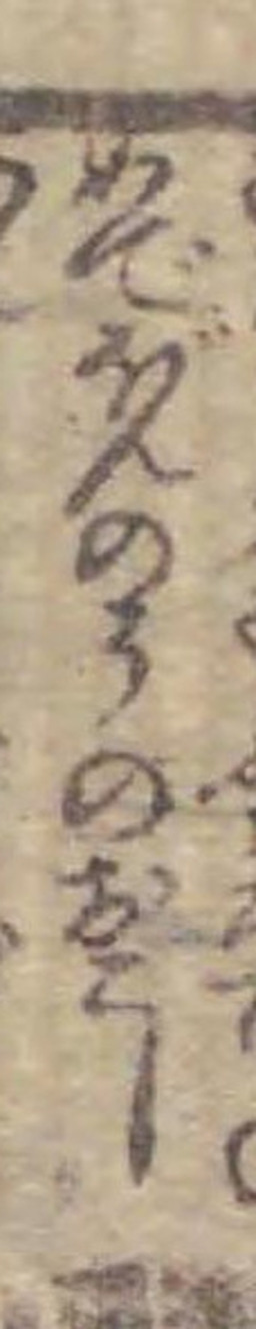めでぼんのうのおこし
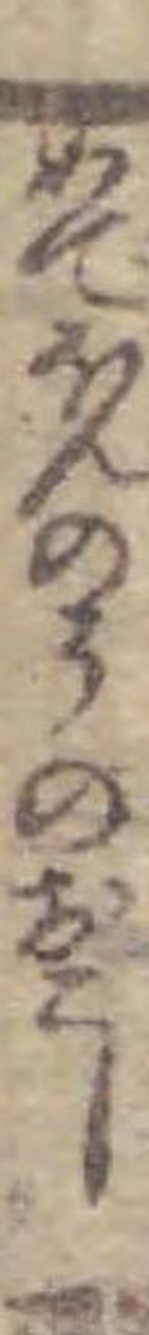めでぼんのうのおこし
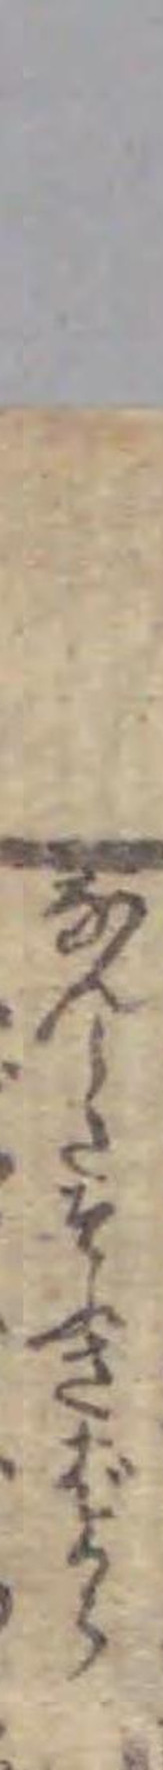なんしたそふさばから
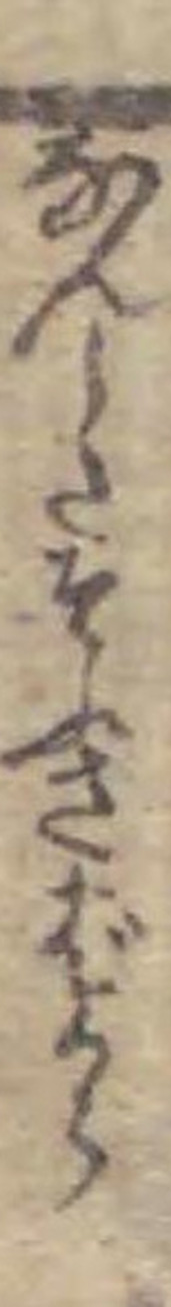なんしたそふさばから
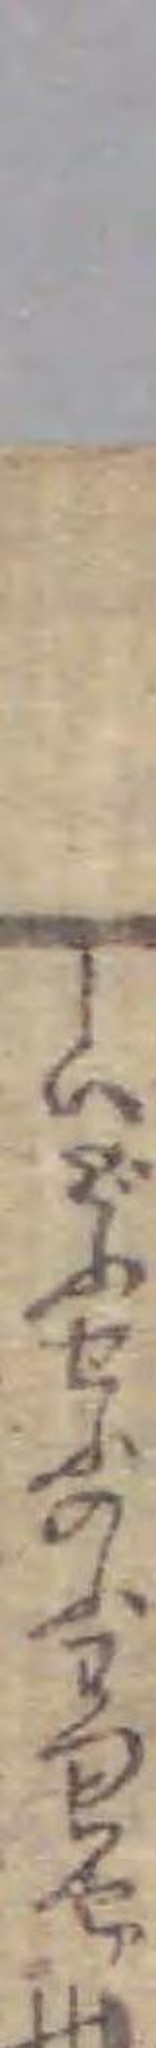しいどふせふのふわつちや
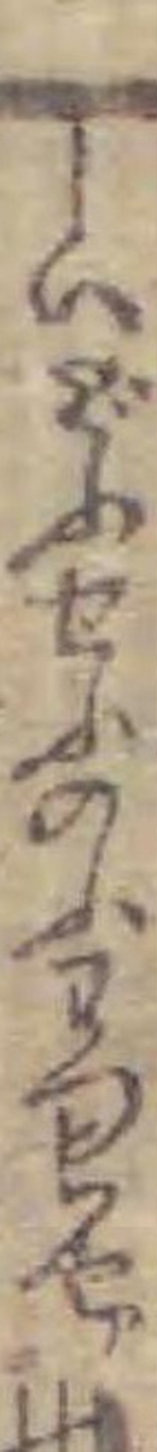しいどふせふのふわつちや
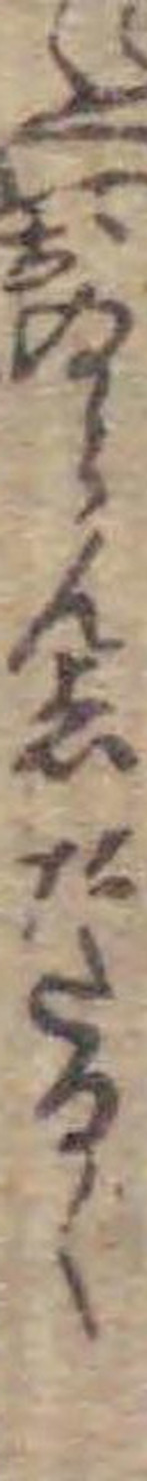おゐらんしたたる〳〵
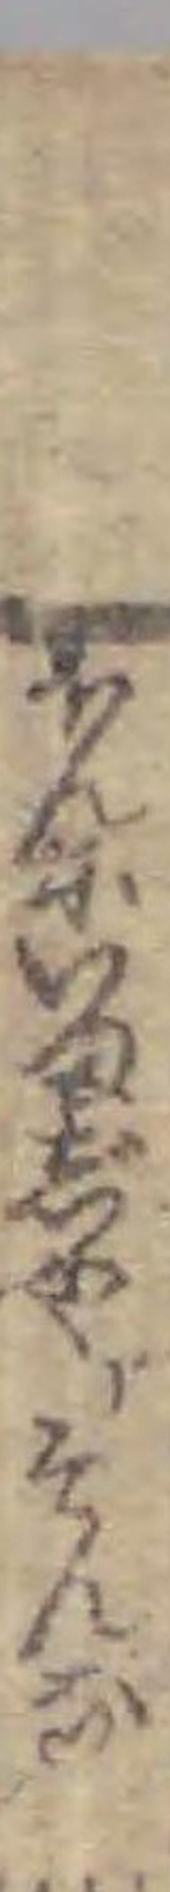ほんにいまじや
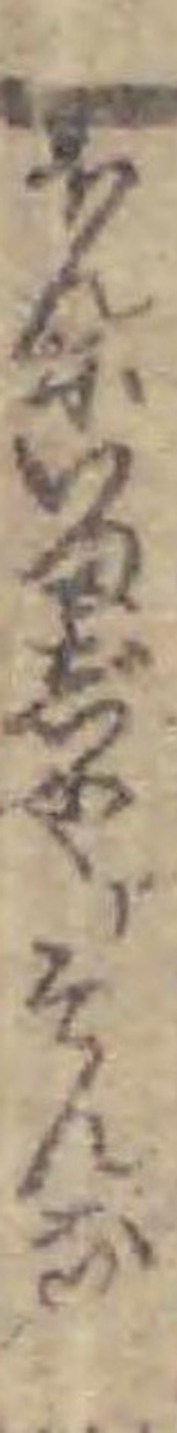ほんにいまじや
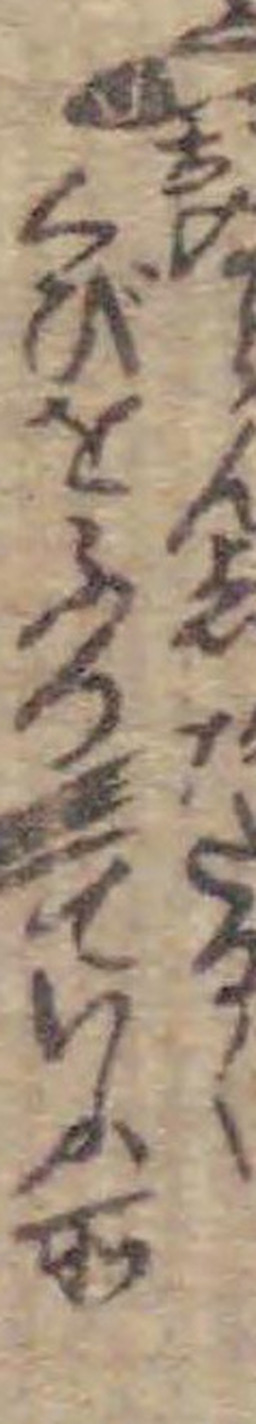くびをふつていふ所
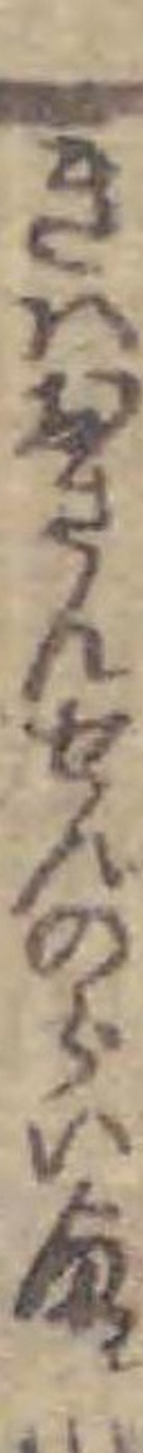きはおさんせんのらいへ
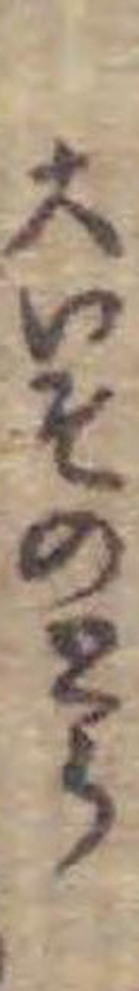大いそのとら
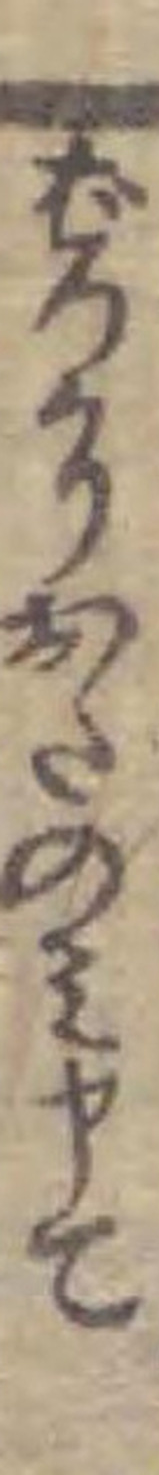ばつかりおたのみ申て
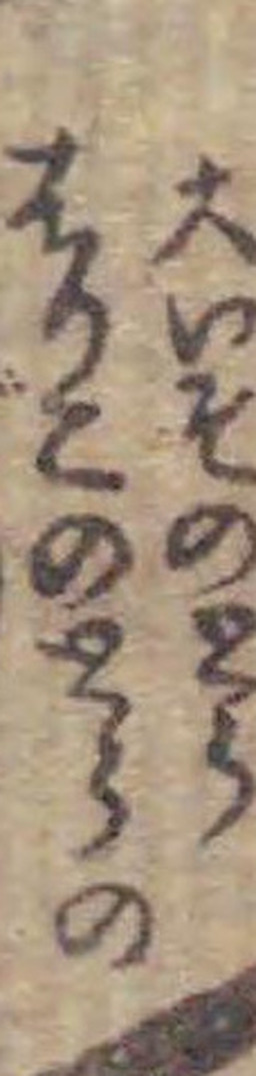はりこのとらの
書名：年寄之冷水曽我 : 3巻
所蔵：国立国会図書館 National Diet Library, JAPAN
